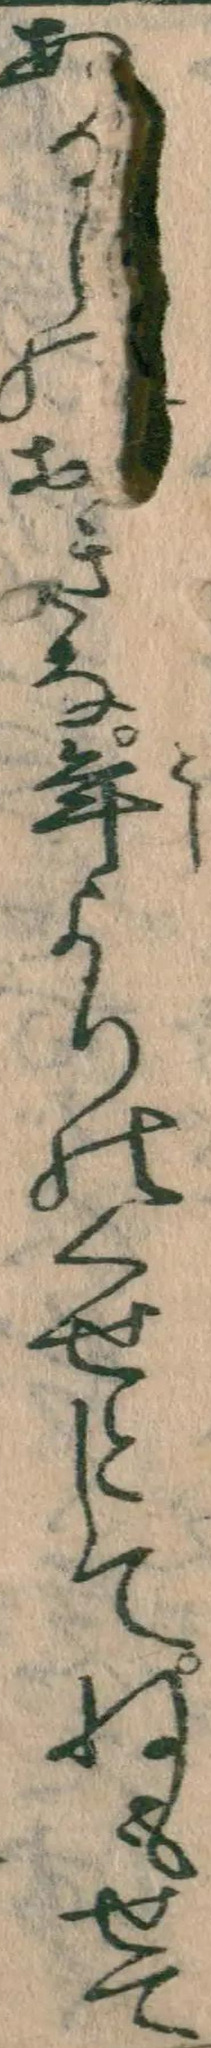あるしのおきな。年よりのくせとして。ねもせて
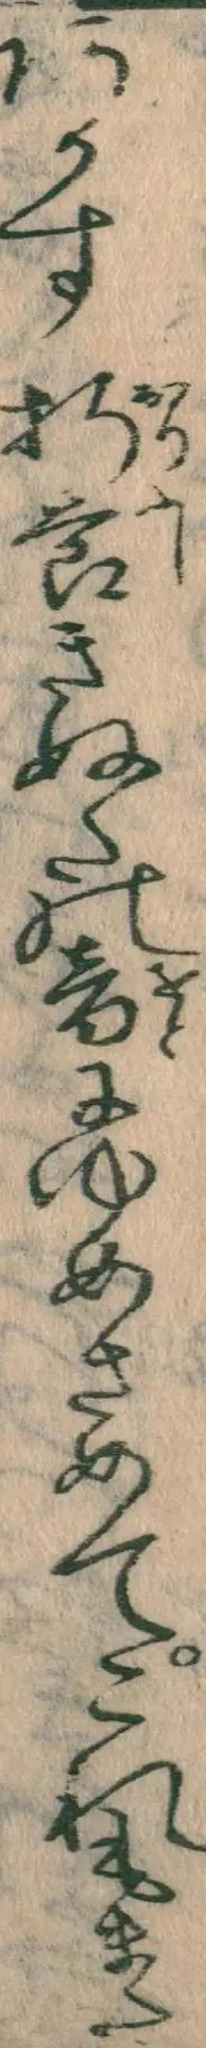あかす折節きぬたの音にゆめさめて。これもまた
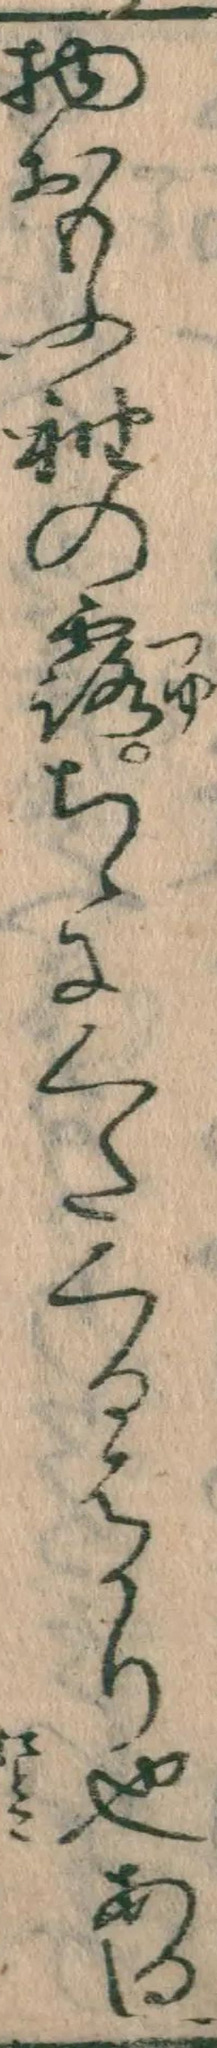物おもふ袖の露。ちゝにくたくるはかり也あるし
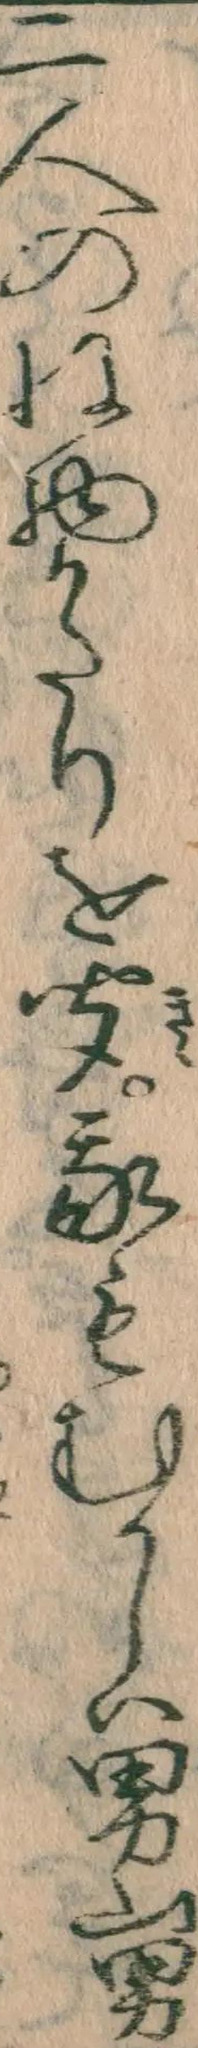二人のね物かたりを聞。我もむかしは男山男
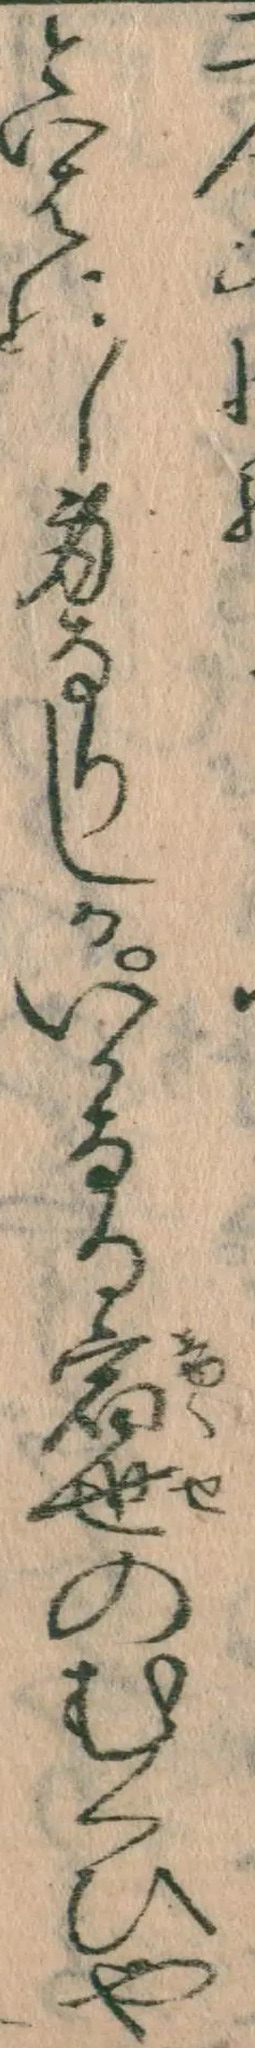といはれし身なりしか。いかなる宿世のむくひや
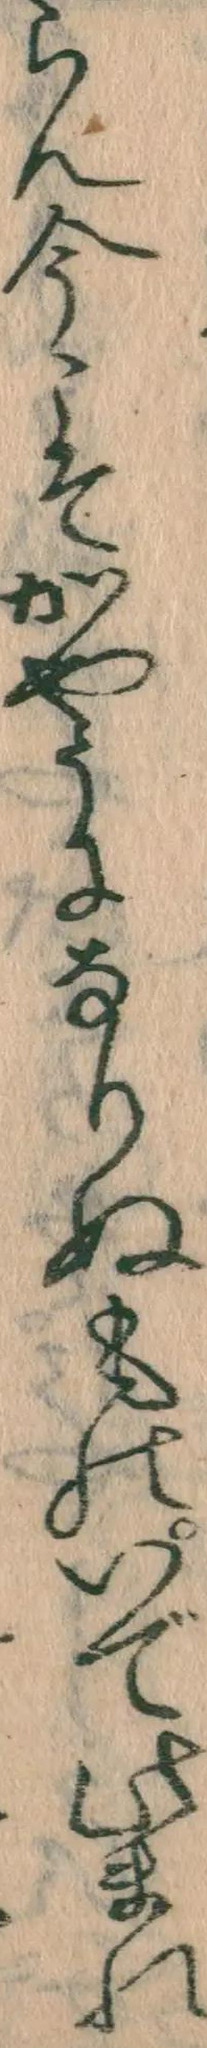らん今こそかやうになりぬもの。いで此まれ
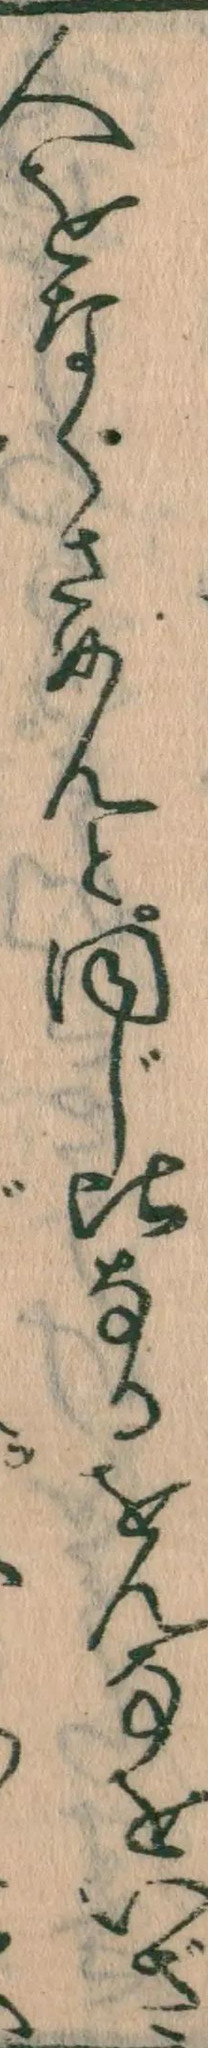人をなぐさめんと。同じ比なるをんなをいざ
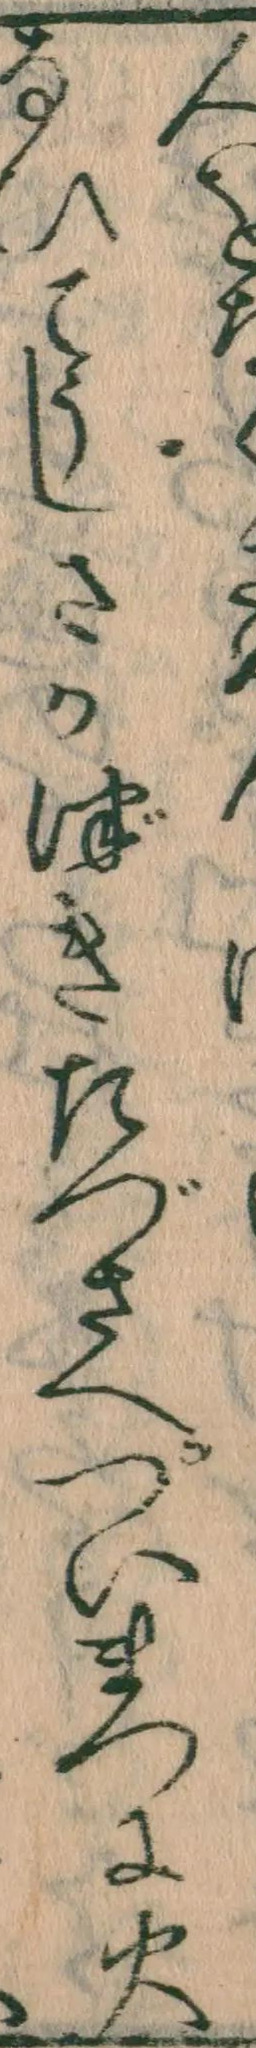なひてうしさかづきたづさへ。ついまつに火
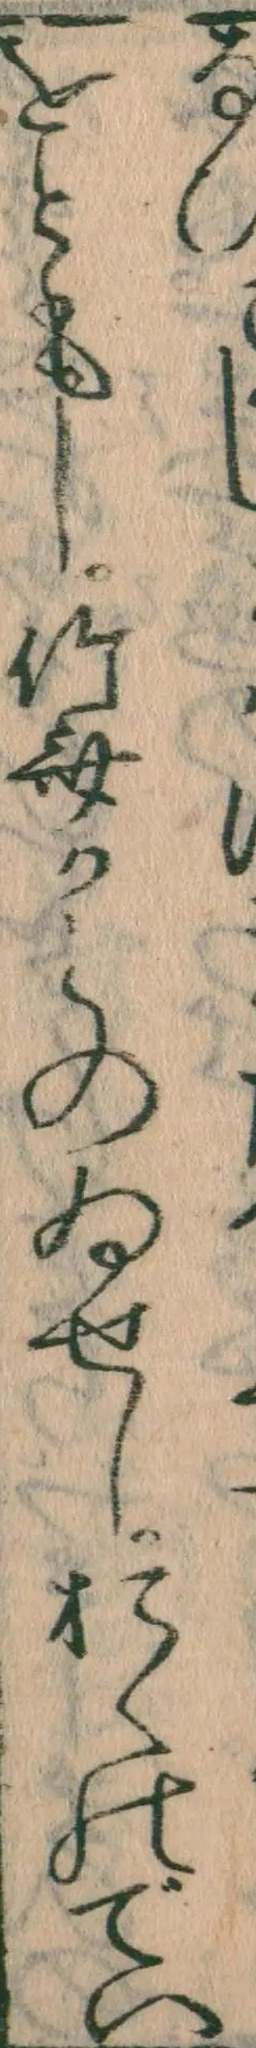をともし。竹斎かとのゐせし。おくのでい
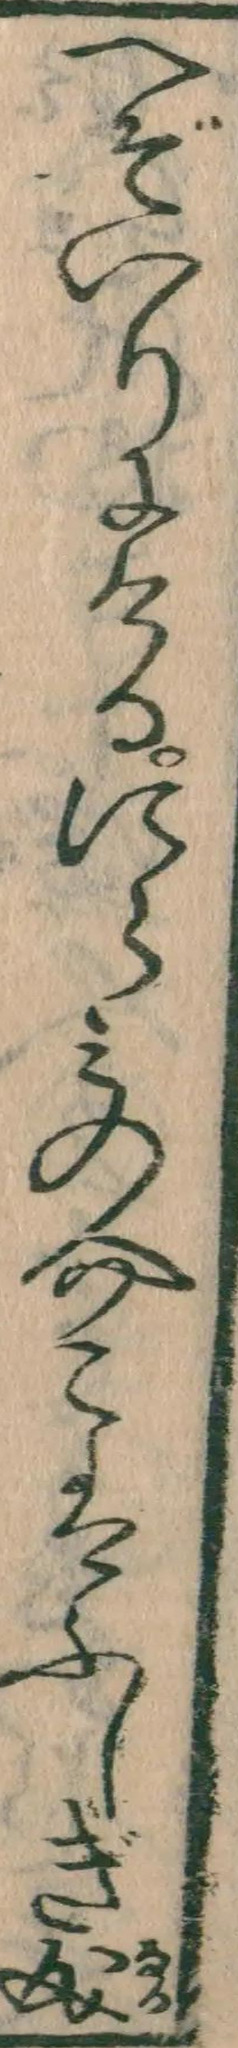へぞいりにける。にらみの介こはふしぎ成
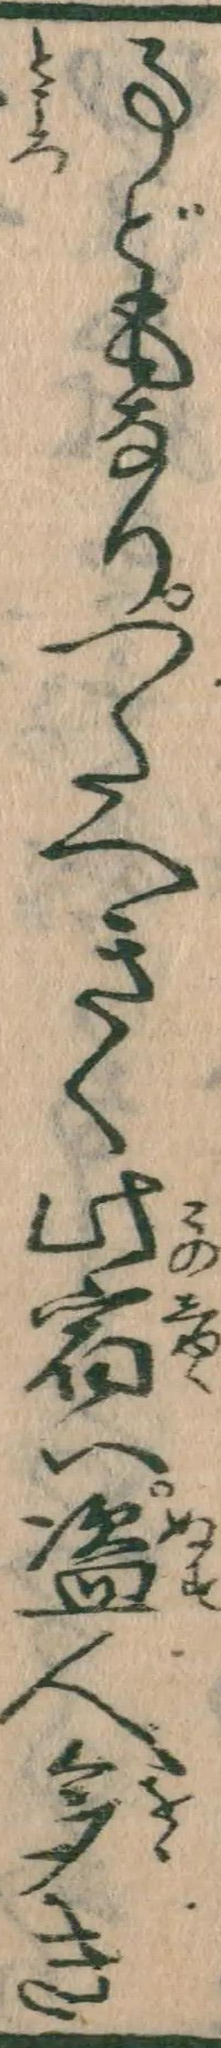事どもなり。つたへきく此宿は。盗人多き
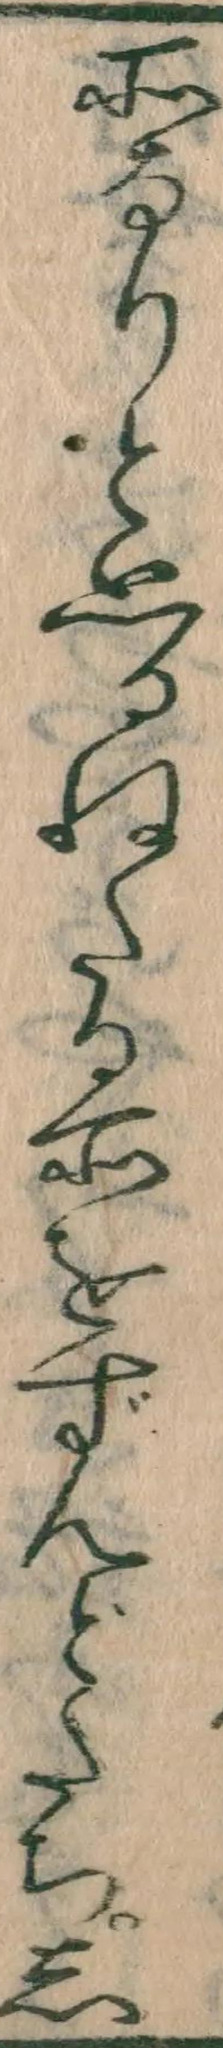所なりと思ひねたる所をずんどたち。し
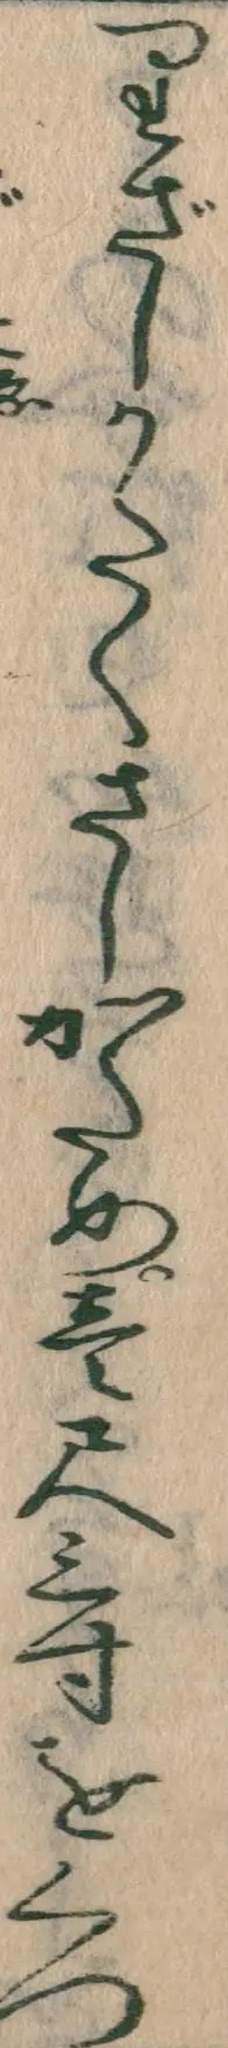りざしかたくさしかため。壱尺三寸をくつ
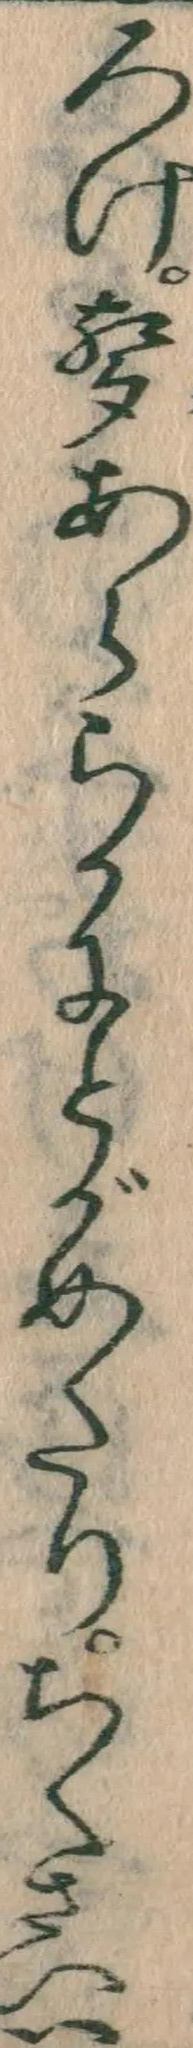ろげ。声あららかにとがめたり。ちくさいは
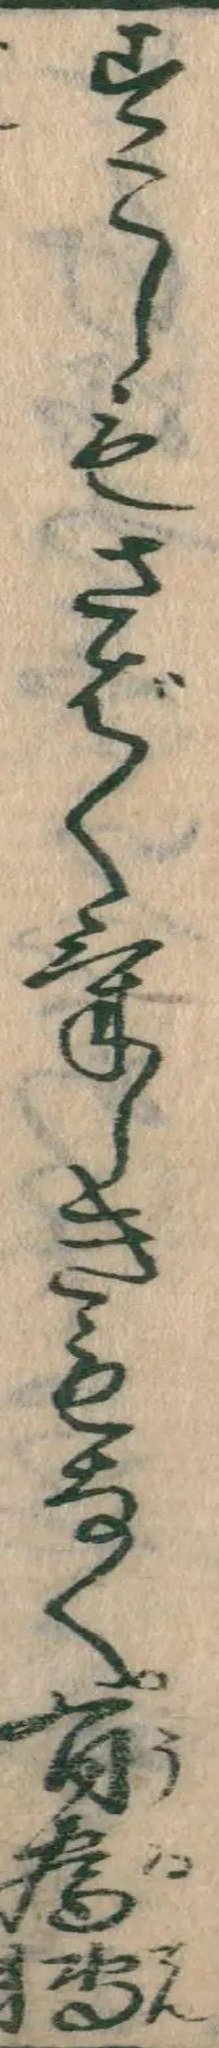すこしもさばくけしきもなく。有為転
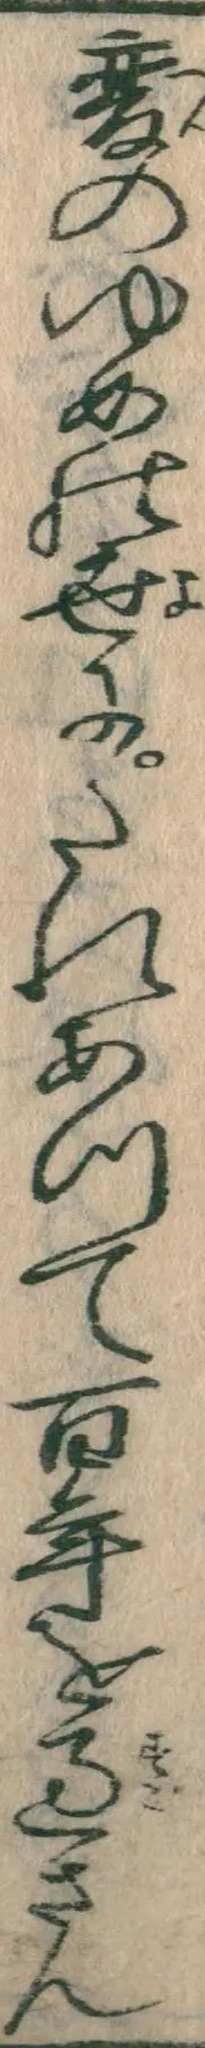変のゆめの世に。たれあつて百年を過さん
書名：竹斎狂歌物語 3巻
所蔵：国立国会図書館 National Diet Library, JAPAN
